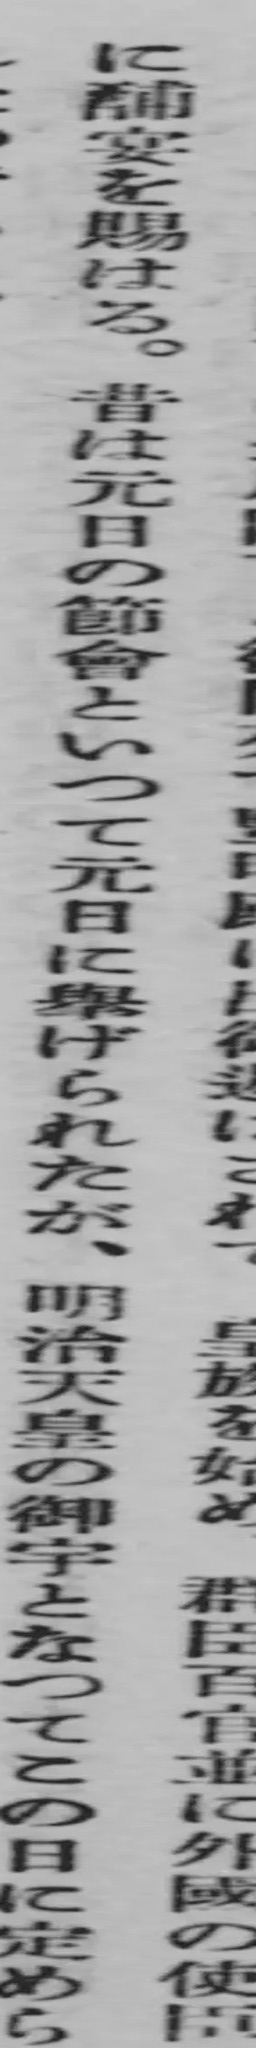に酺宴を賜はる。昔は元日の節會といつて元日に擧げられたが、明治天皇の御宇となつてこの日に定めら
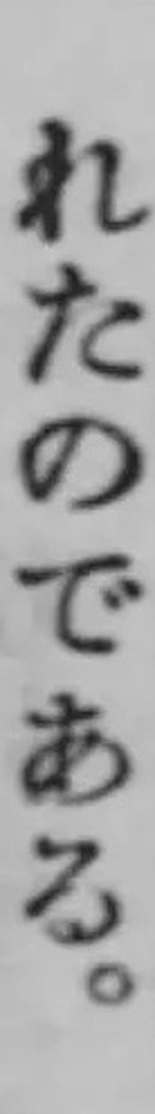れたのである。
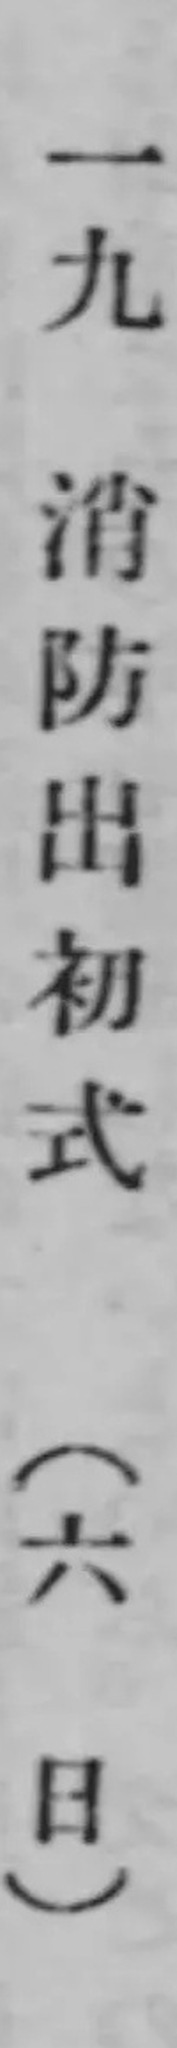一九消防出初式(六日)
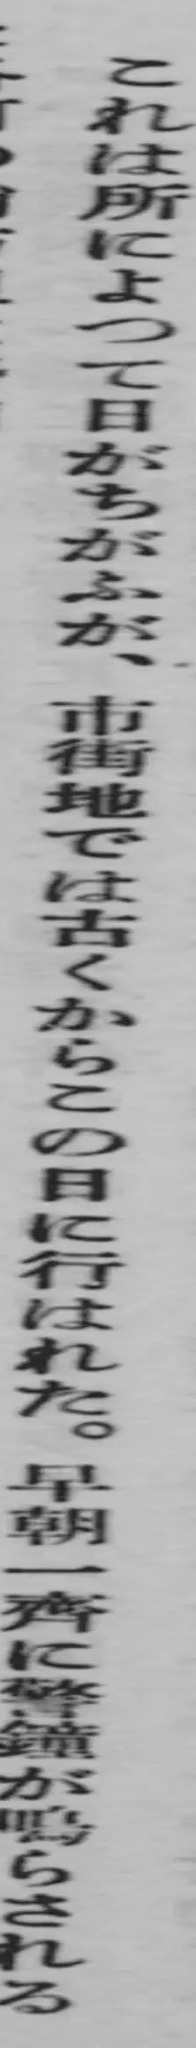これは所によつて日がちがふが、市街地では古くからこの日に行はれた。早朝一齊に警鐘が鳴らされる
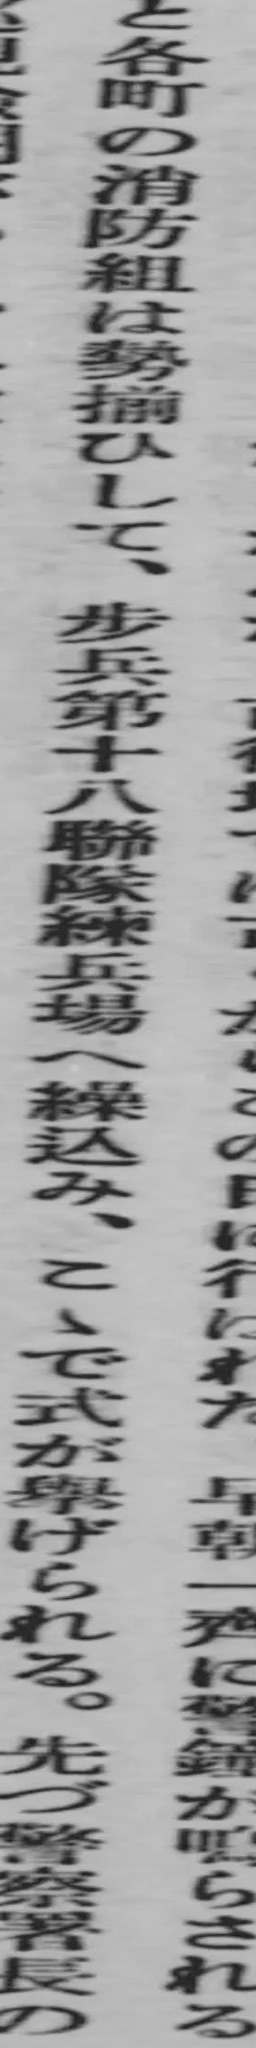と各町の消防組は勢揃ひして、歩兵第十八聯隊練兵場へ繰込み、こゝで式が擧げられる。先づ警察署長の
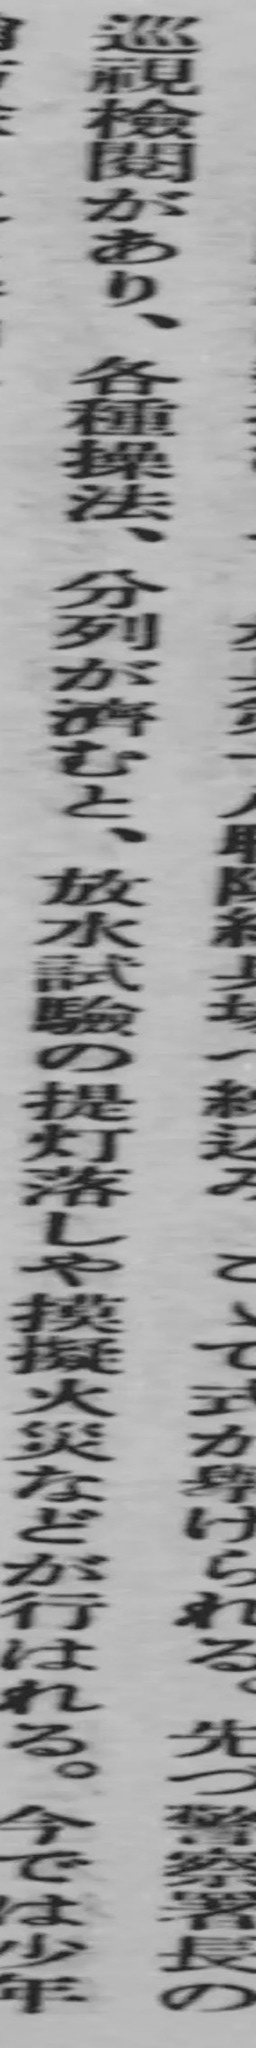巡視檢閱があり、各種操法、分列が濟むと、放水試驗の提灯落しや摸擬火災などが行はれる。今では少年
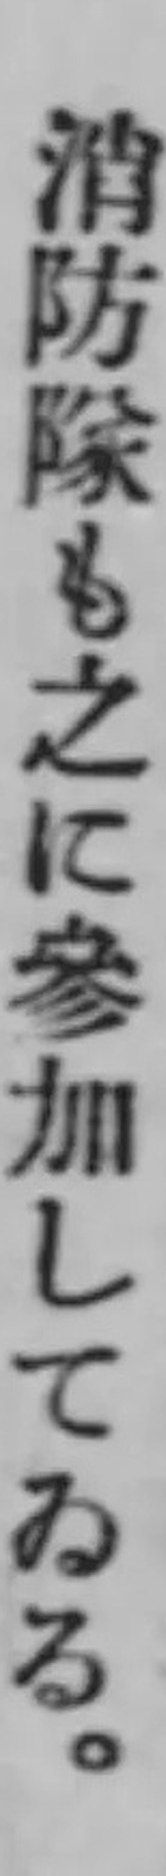消防隊も之に參加してゐる。
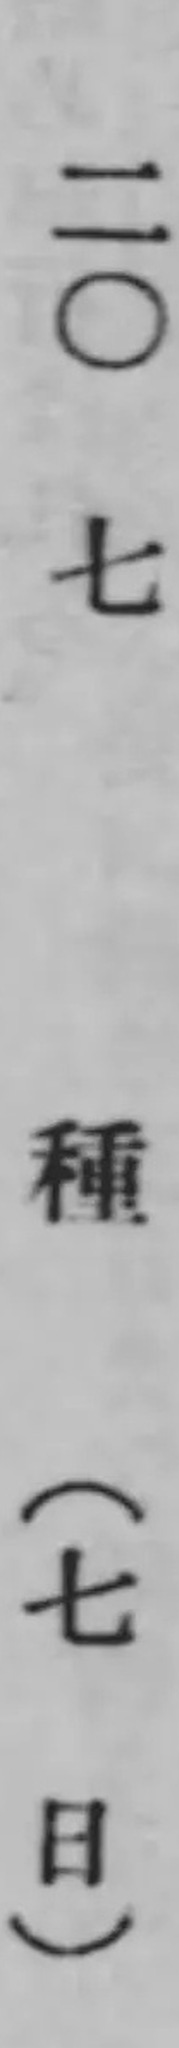二〇七種(七日)
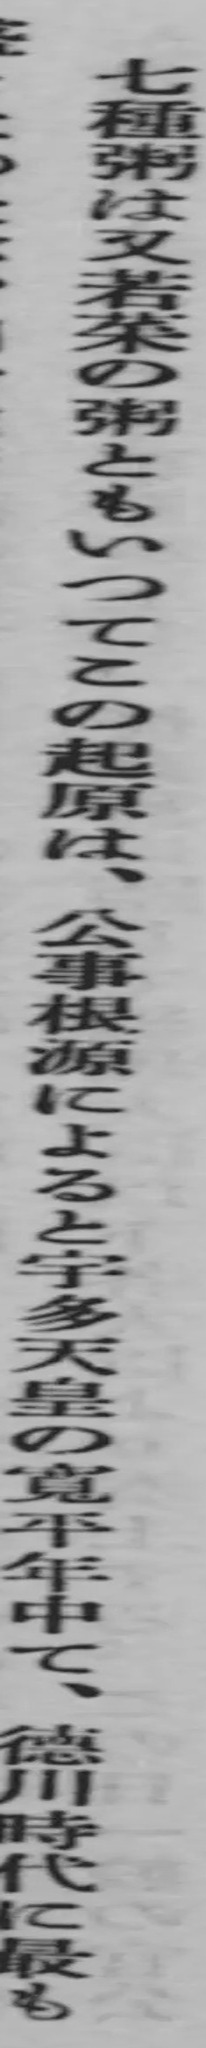七種粥は又若菜の粥ともいつてこの起原は、公事根源によると宇多天皇の寛平年中て、徳川時代に最も
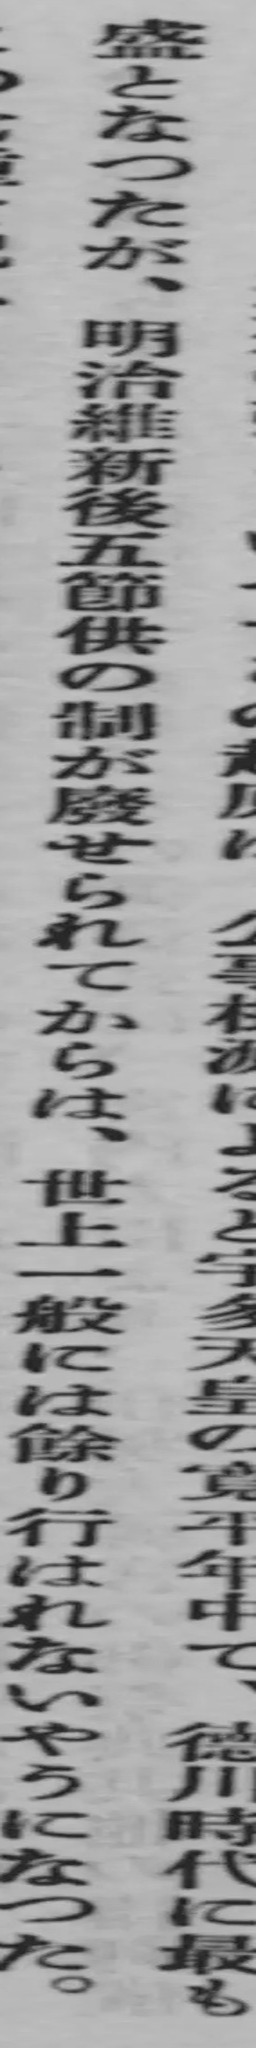盛になつたが、明治維新後五節供の制が廢せられてからは、世上一般には餘り行はれないやうになつた。
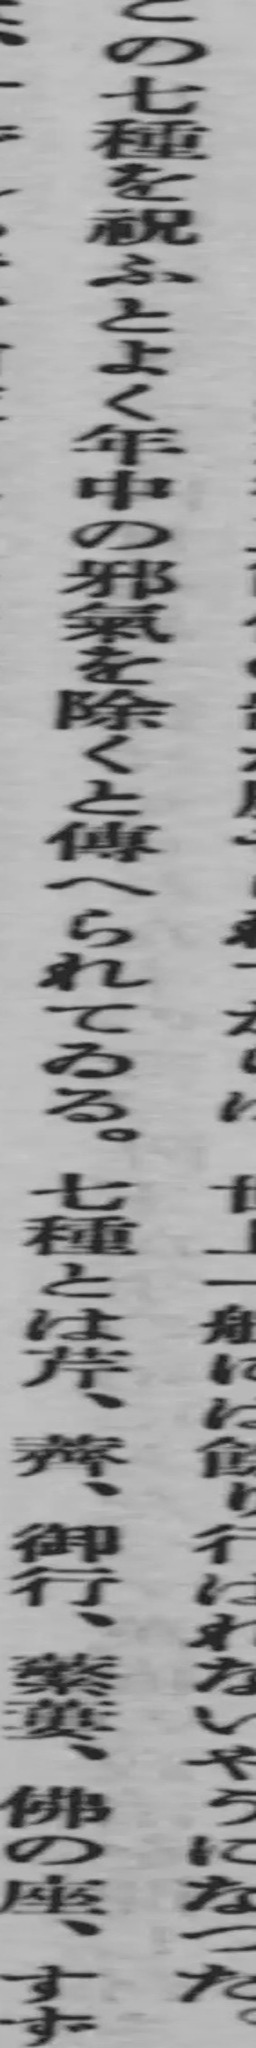この七種を祝ふとよく年中の邪氣を除くと傳へられてゐる。七種とは、芹、薺、御行、蘩蔞、佛の座、すず
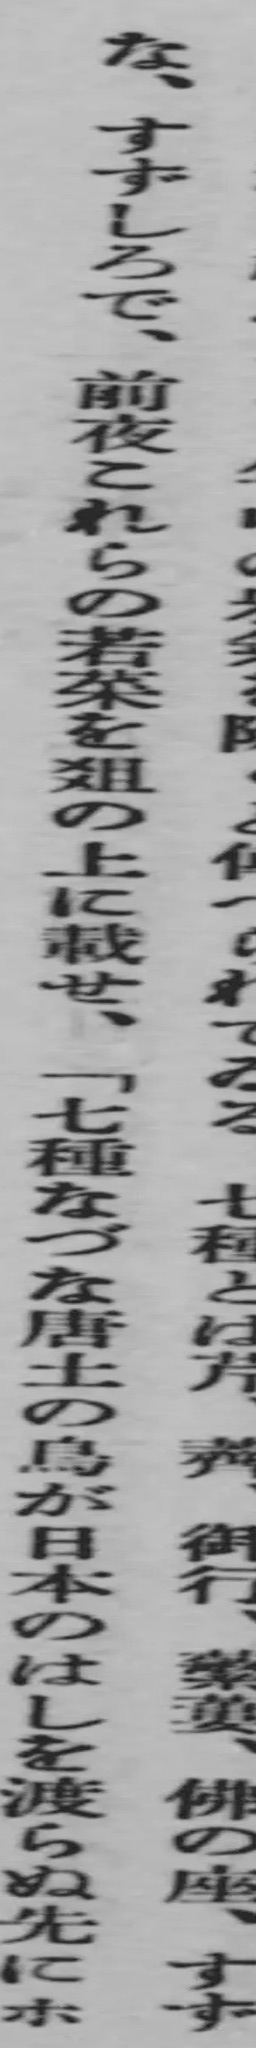な、すずしろで、前夜これらの若菜を俎の上に載せ、「七種なづな唐土の鳥が日本のはしを渡らぬ先にホ
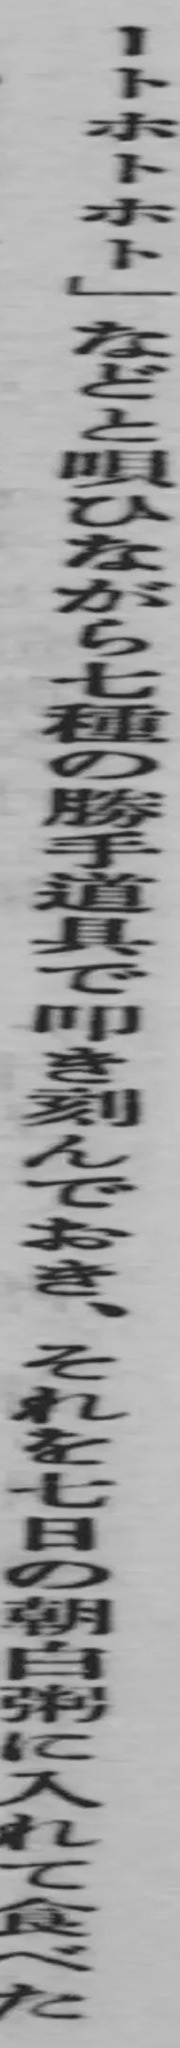ートホトホト」などと唄ひながら七種の勝手道具で叩き刻んでおき、それを七日の朝白粥に入れて食べた
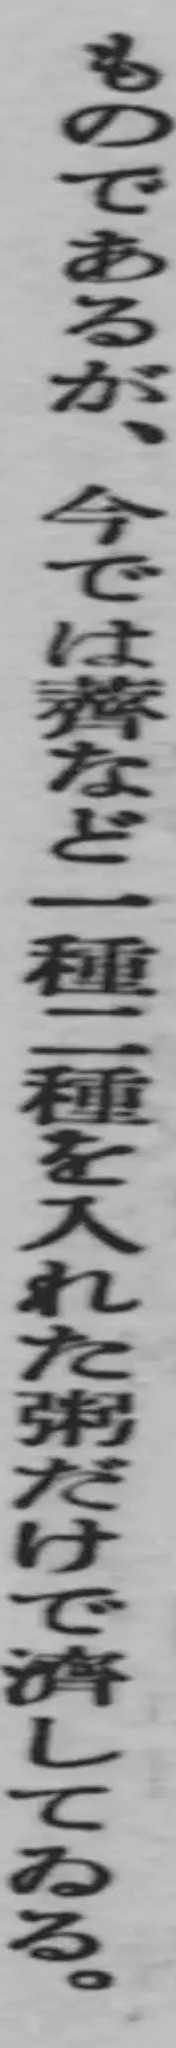ものであるが、今では薺など一種二種を入れた粥だけで濟してゐる。
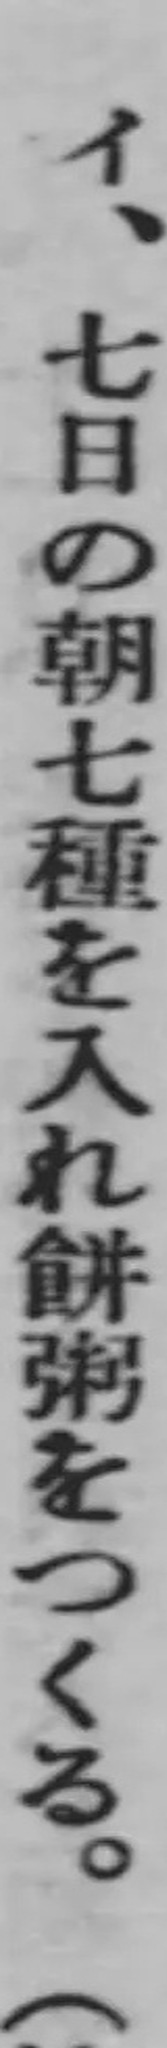イ、七日の朝七種を入れ餅粥をつくる。(植田)
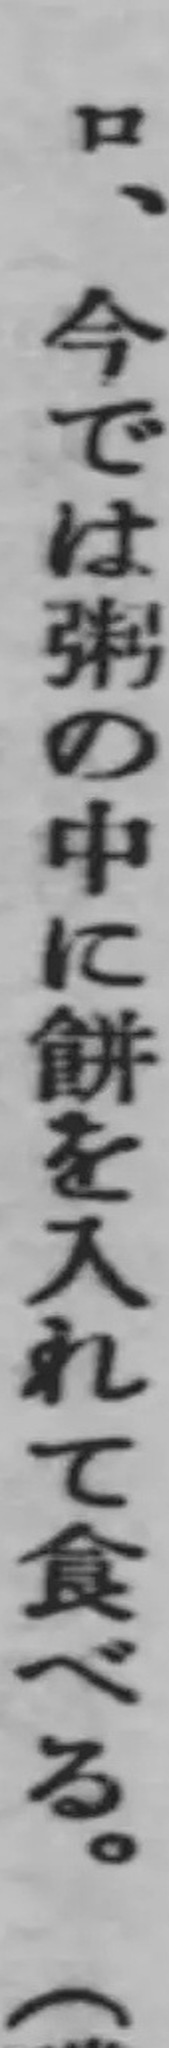ト、今では粥の中に餅を入れて食べる。(磯邊)
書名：豊橋の年中行事
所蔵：国立国会図書館 National Diet Library, JAPAN
